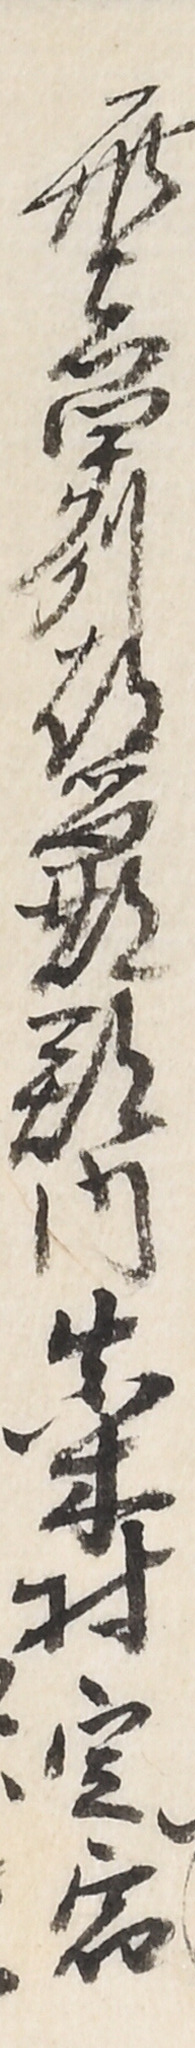此者甲州都留郡郡内小向村定宿清七
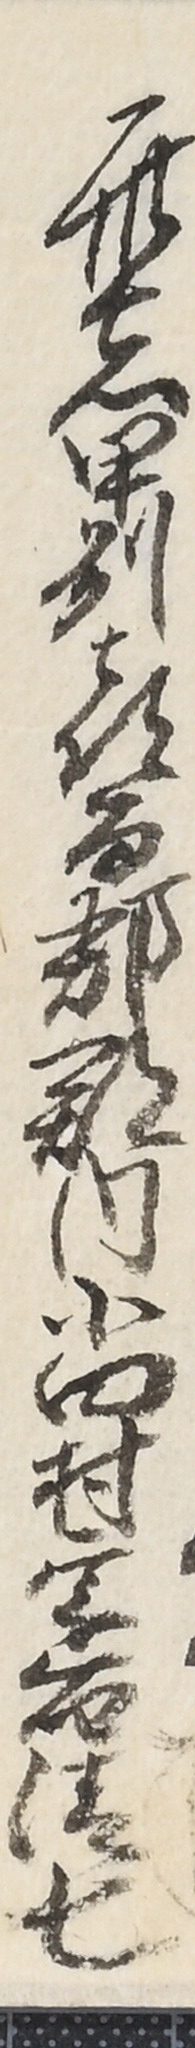此者甲州都留郡郡内小向村定宿清七
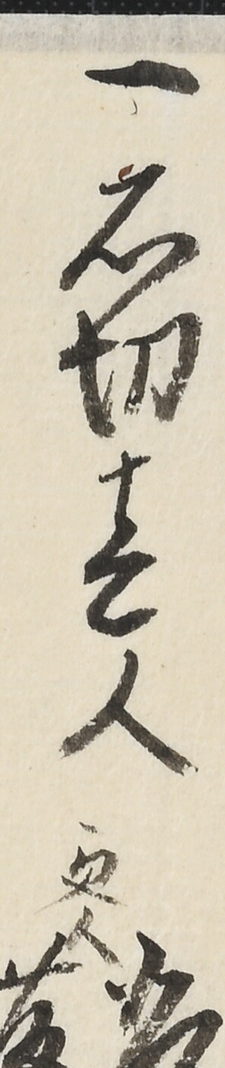一石切壱人瀧松㊞
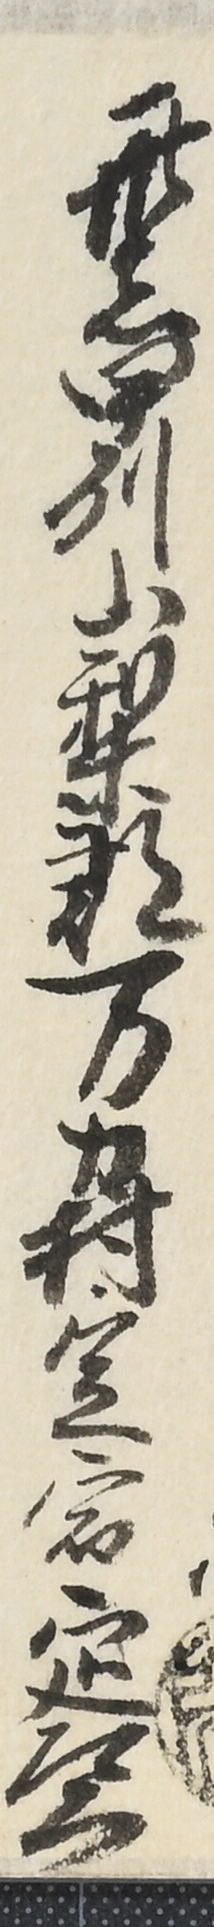此者甲州山梨郡万力村定宿定左衛門
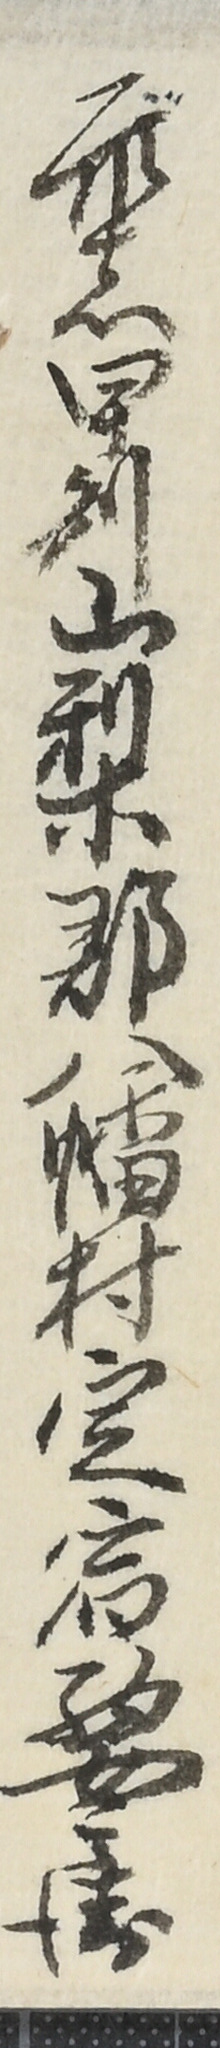此者甲州山梨郡八幡村定宿要兵衛

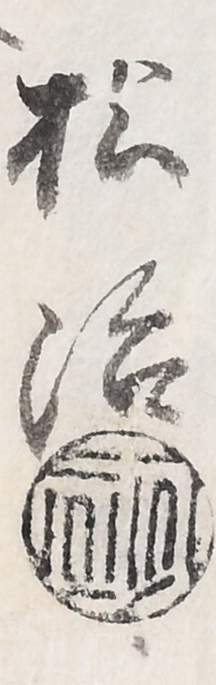松治㊞
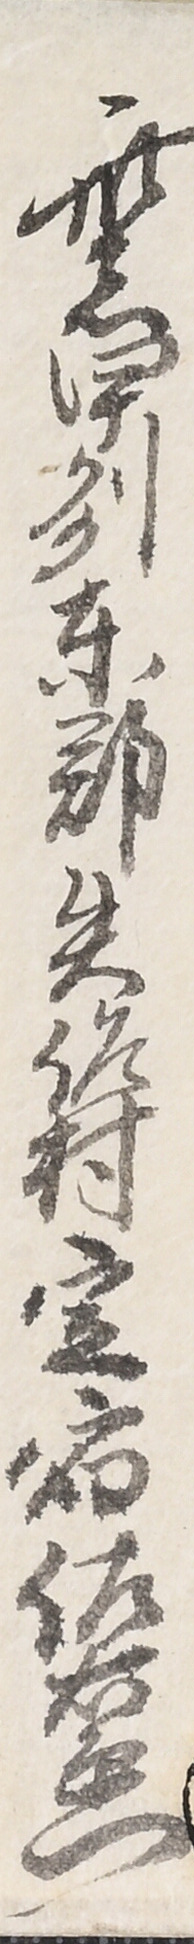此者甲州東郡矢作村定宿佐右衛門
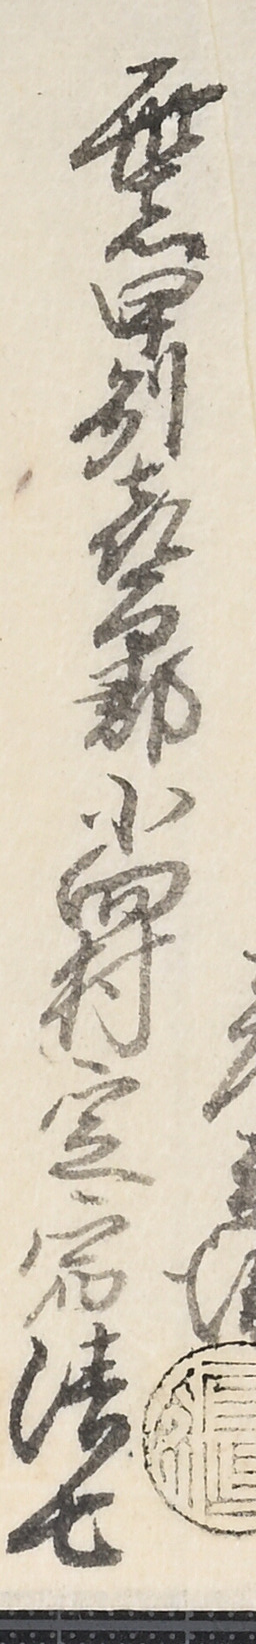此者甲州都留郡小向村定宿清七
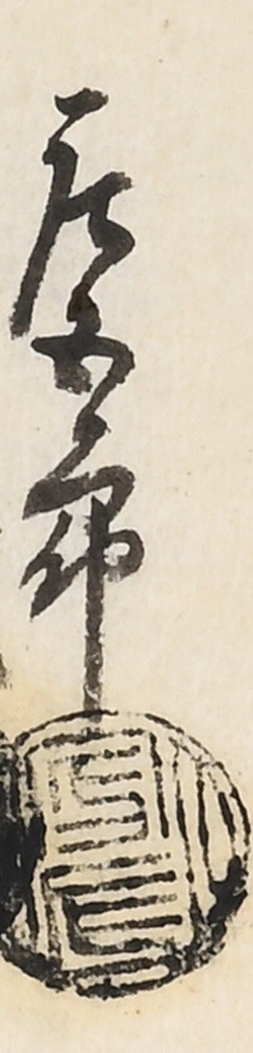庄五郎
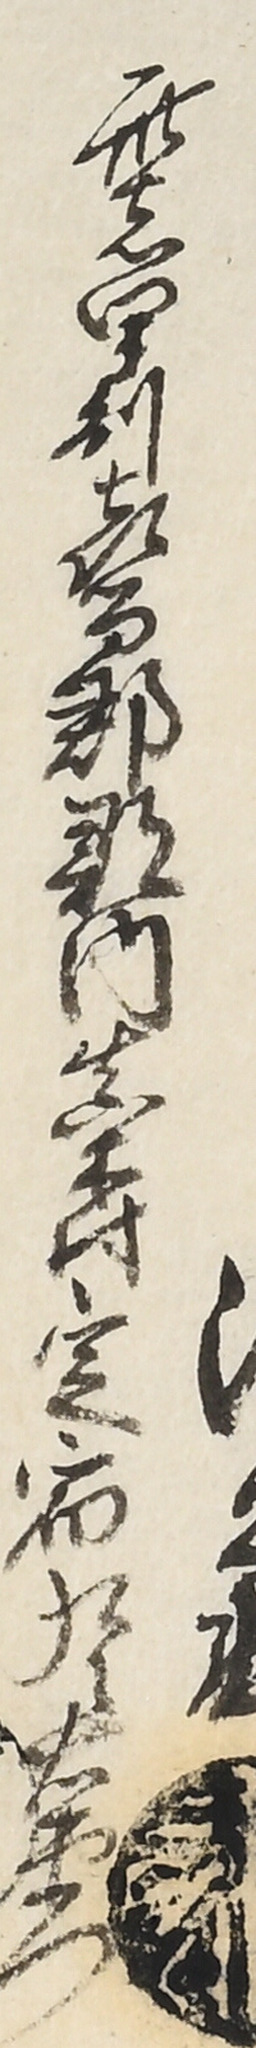此者甲州都留郡郡内真木村定宿九郎右衛門
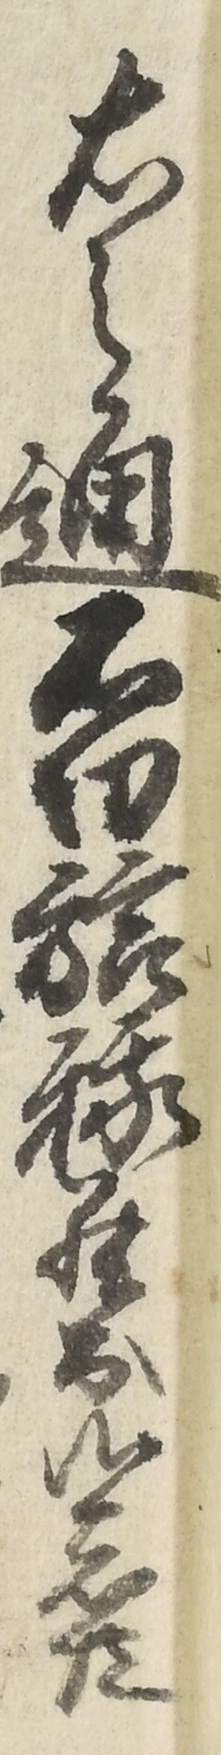右之通石切旅稼罷出候者共
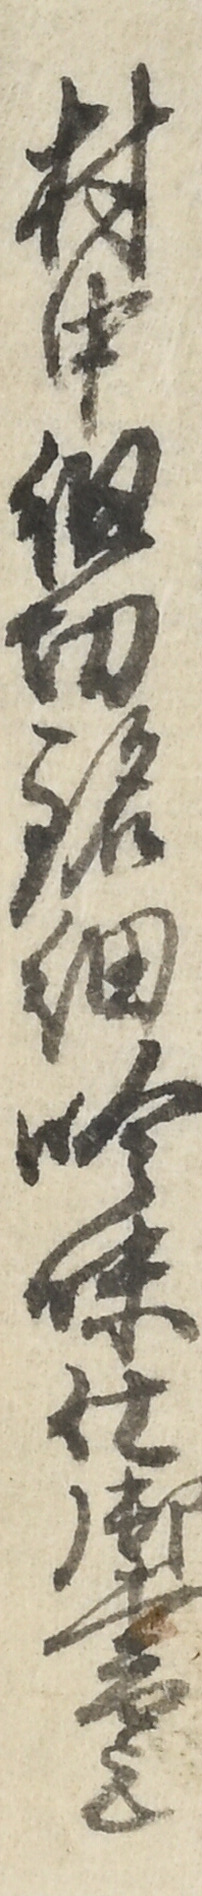村中組切銘細吟味仕御書
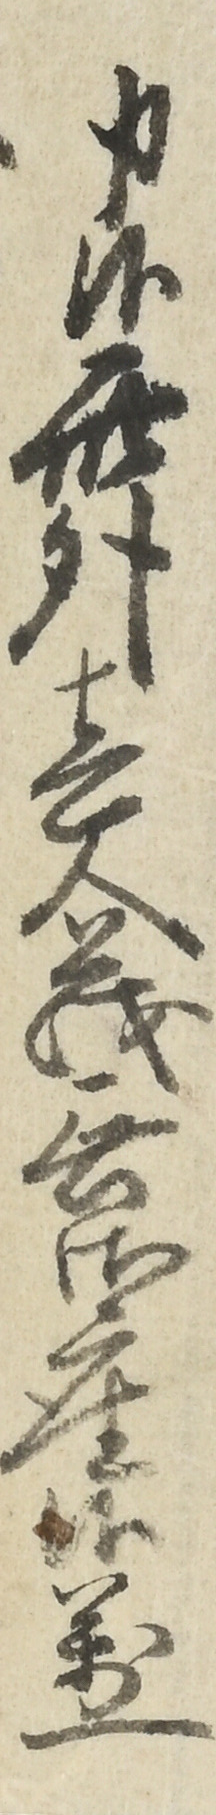申候此外壱人茂無御座候万一
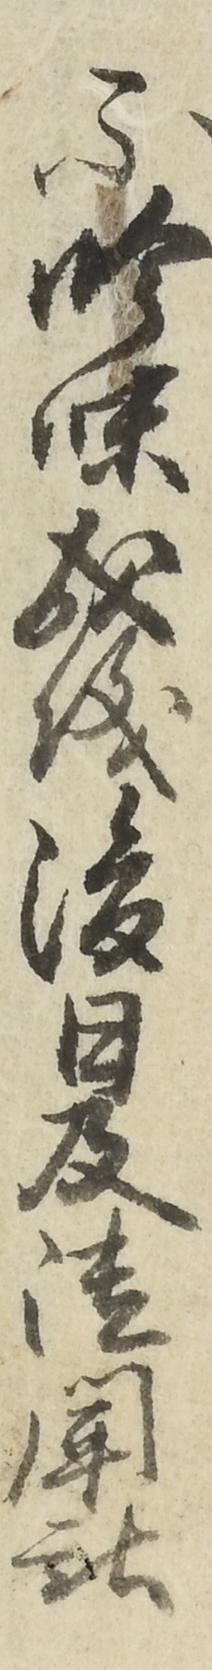不吟味成儀後日及御聞被
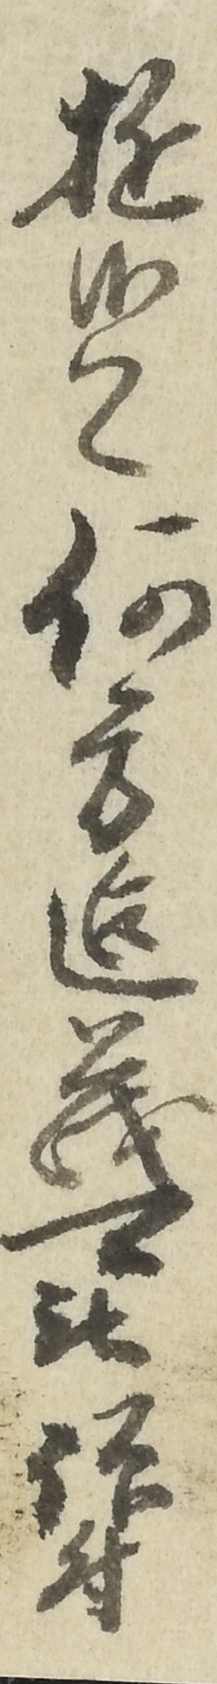遊候ハヽ何方迄茂可被仰付
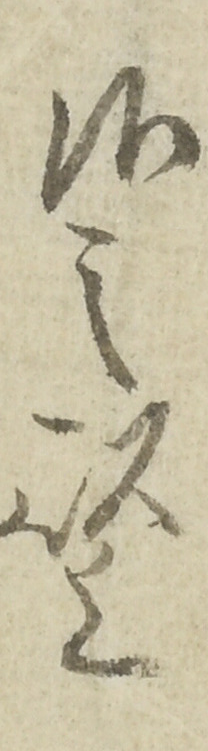候之以上
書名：慶應二丙寅年二月他國出石切名前書上帳
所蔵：伊那市立高遠町図書館・合同会社AMANE
